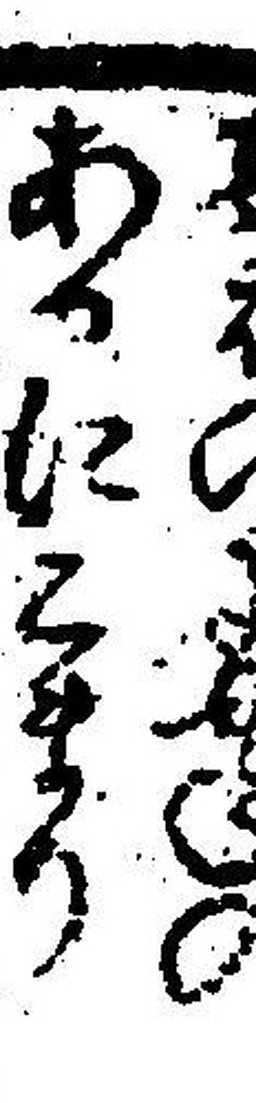あるにこまり
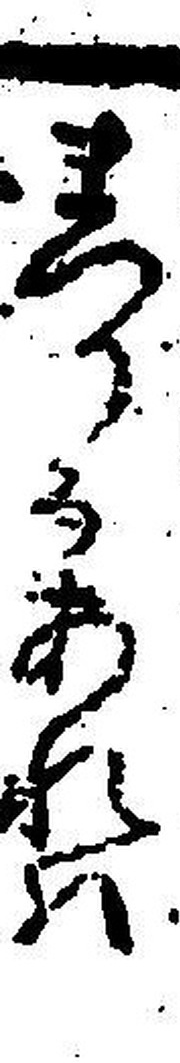まつりかあれは
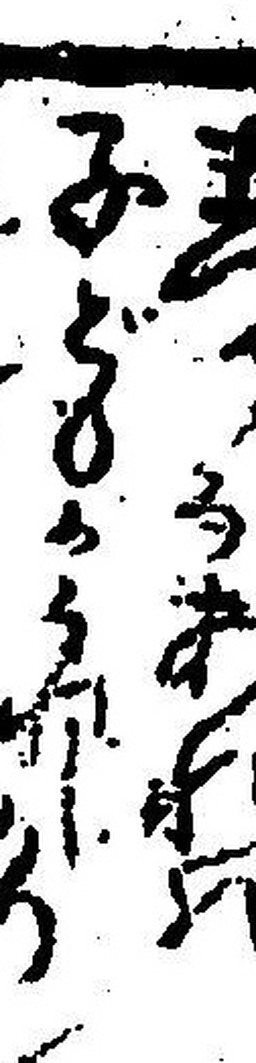子どもかうれしかり
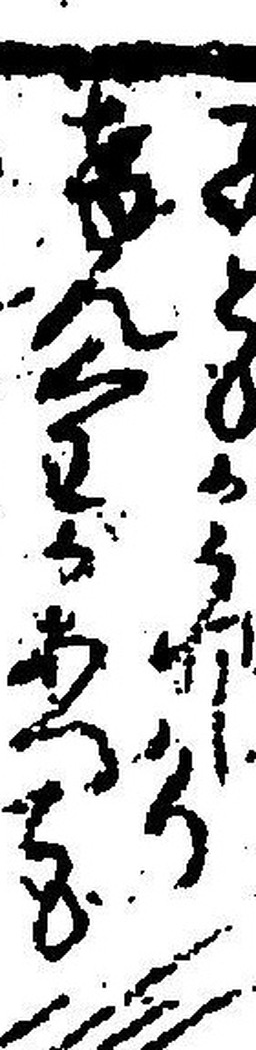けんくわかあつても
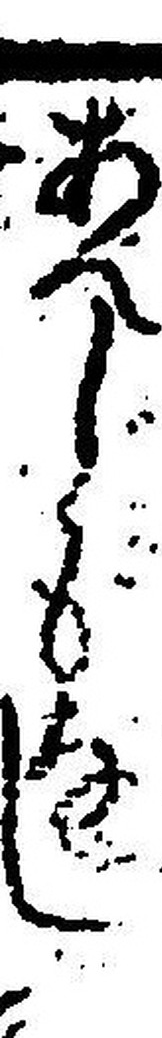あんじもなし
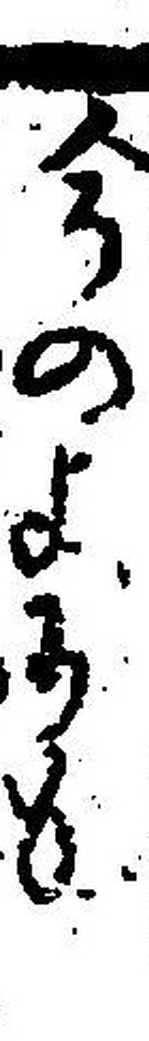今のよにも
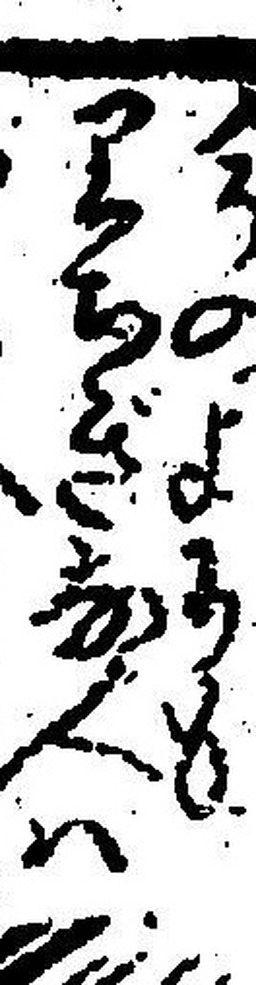りちぎな人は
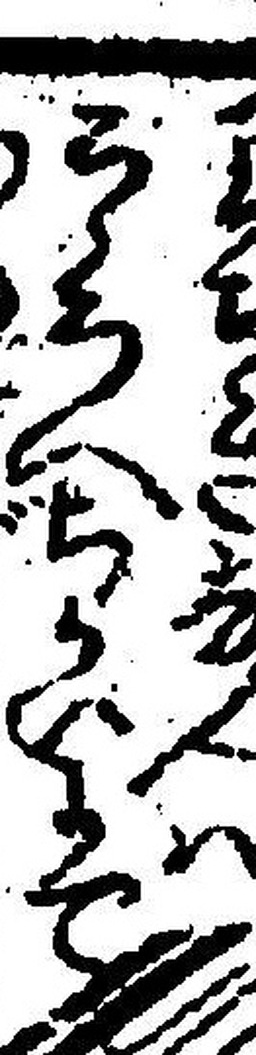こゝろへちかいにて
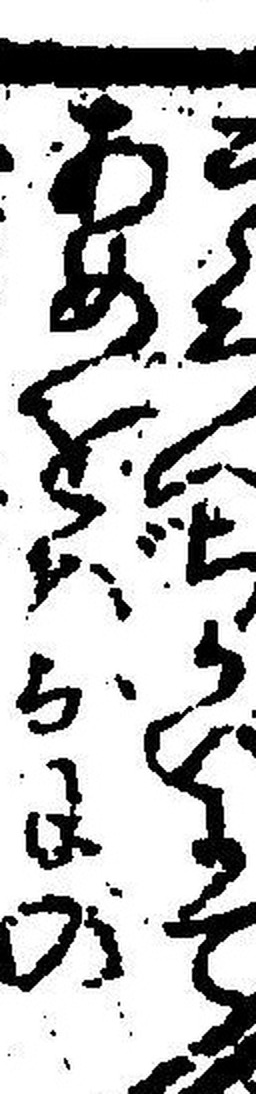あめをばおにの
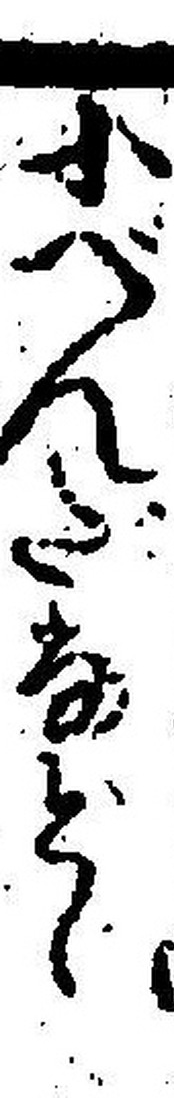小べんだなどと
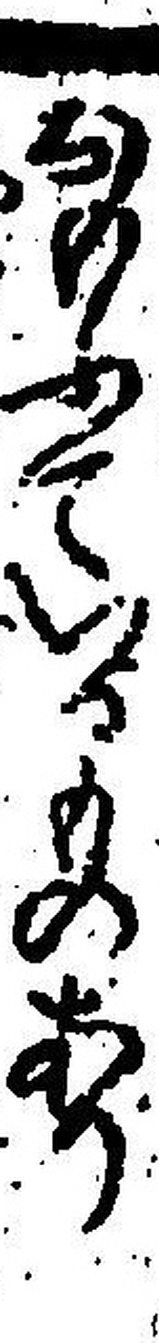おもふているものあり
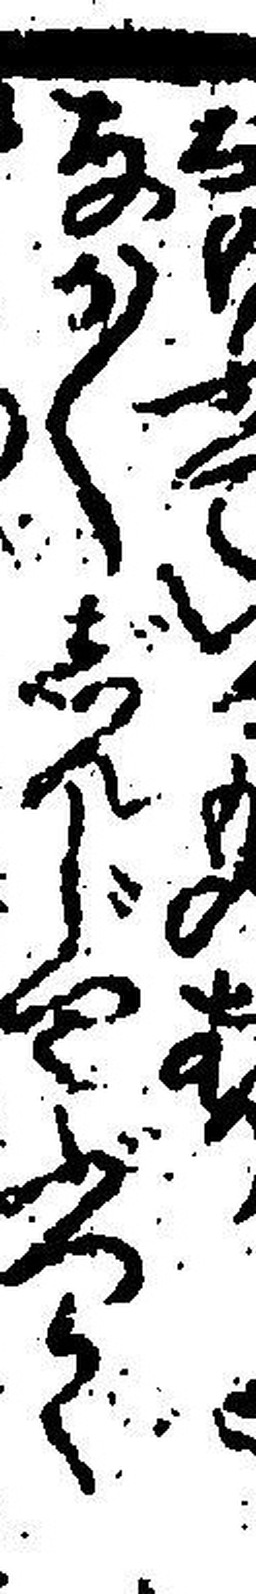なか〳〵じんじやぶつかく
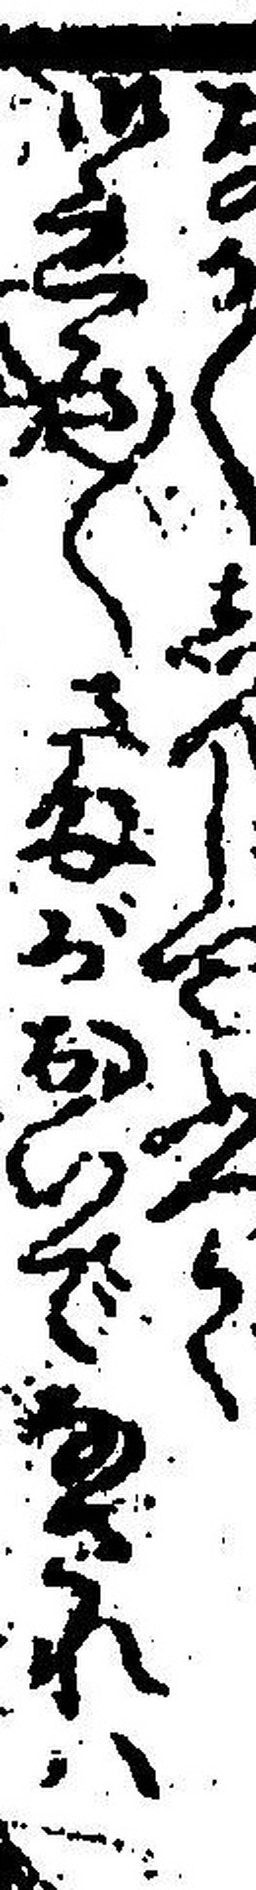御れき〳〵さまがおいでなされは
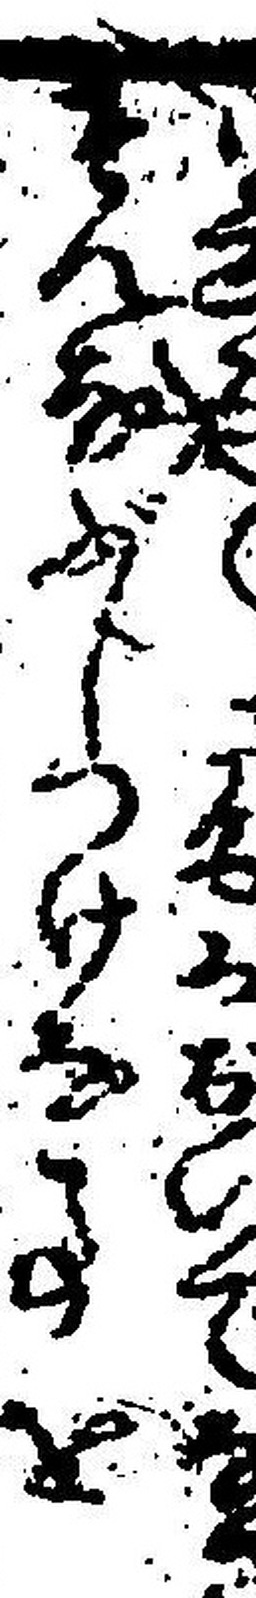そんなぶしつけな事を
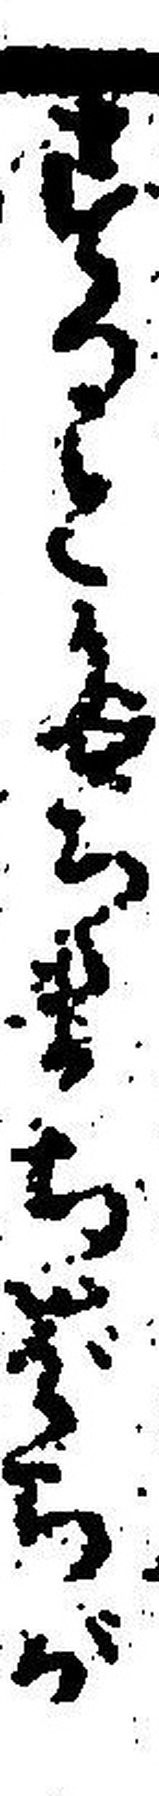するとたちまちばちが
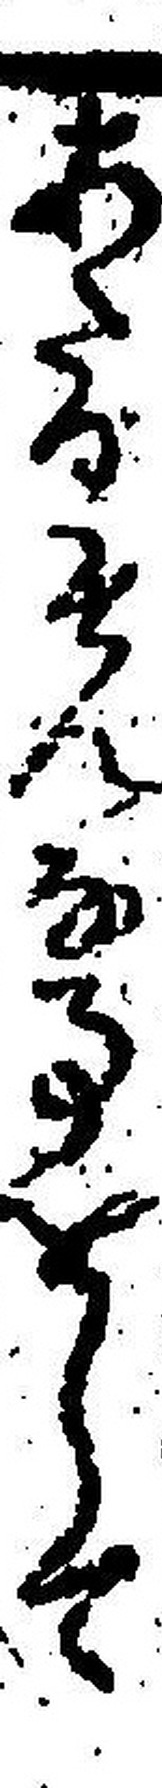あたるそんな事をして
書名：天竺儲之筋 / 市場通笑作
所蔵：東京大学総合図書館 General Library in the University of Tokyo, JAPAN
